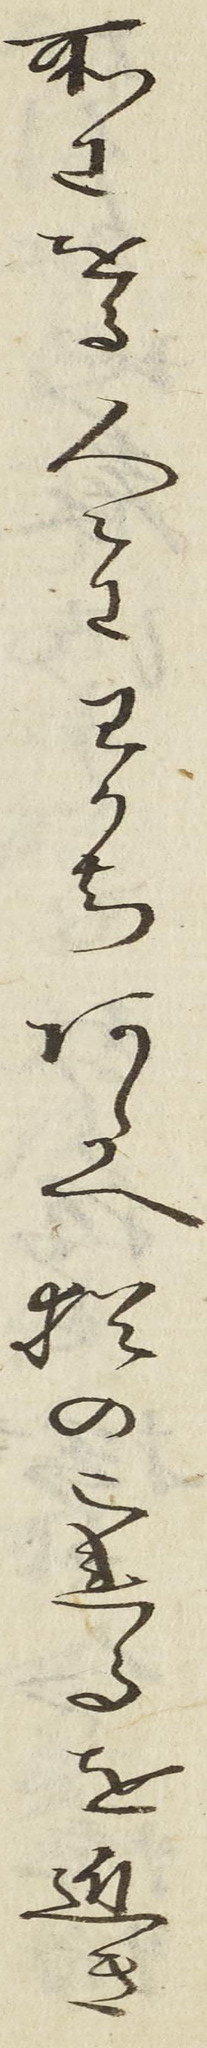所にをる人〻にわかちあたへ猶のこれるを近き
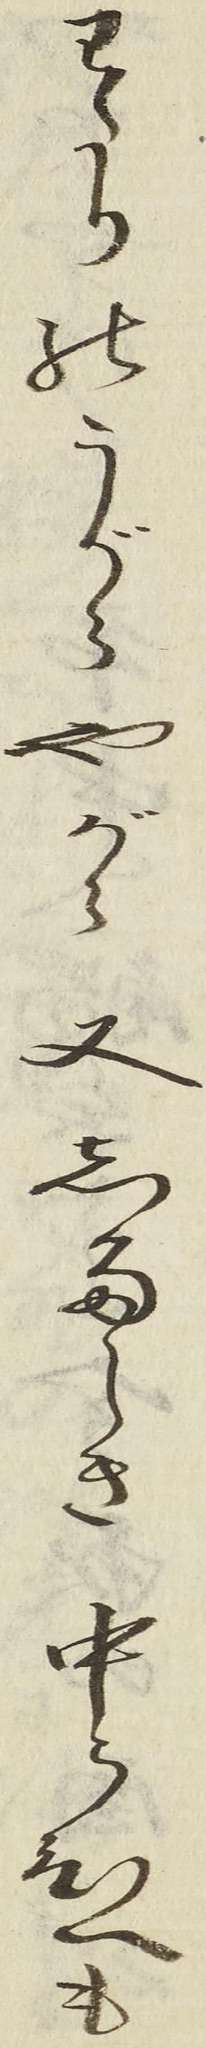わたりのうがらやがら又したしき中らひへも
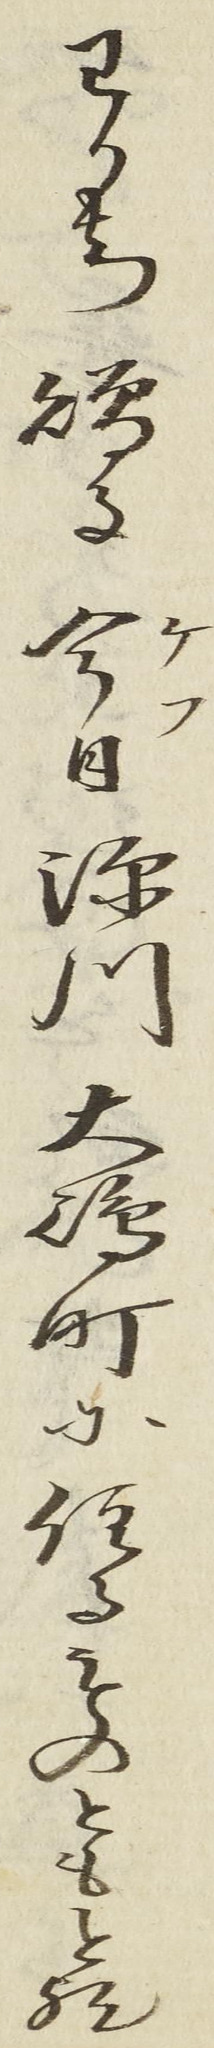わかち贈る今日深川大島町に住るものともと歟
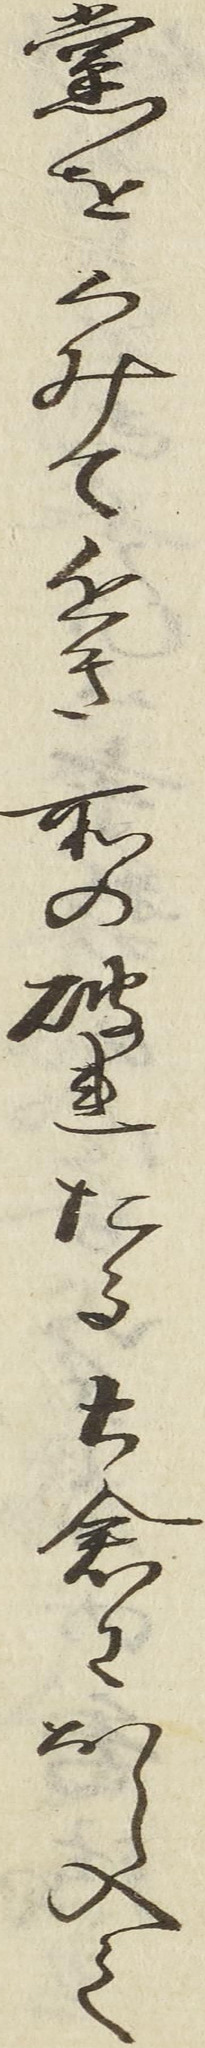党をくみて近き所の破れたる土倉におし入て
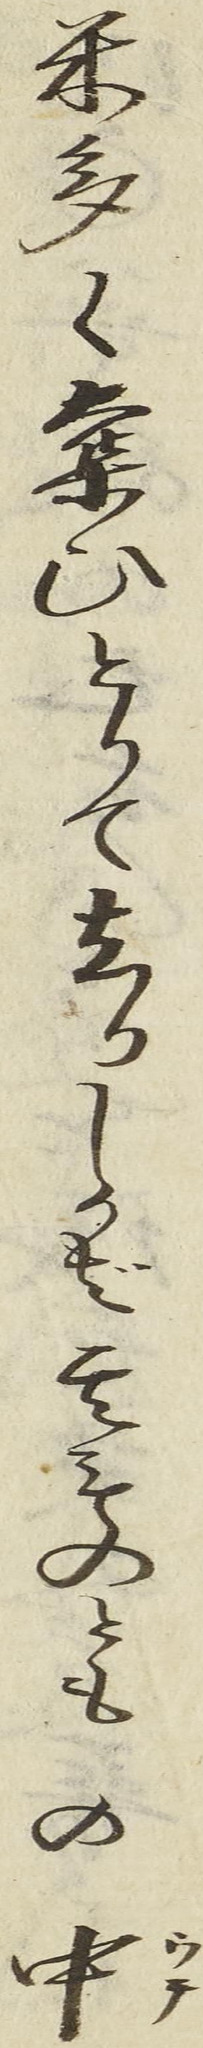米を多く奪ひとりて去りしかば其ものともの中

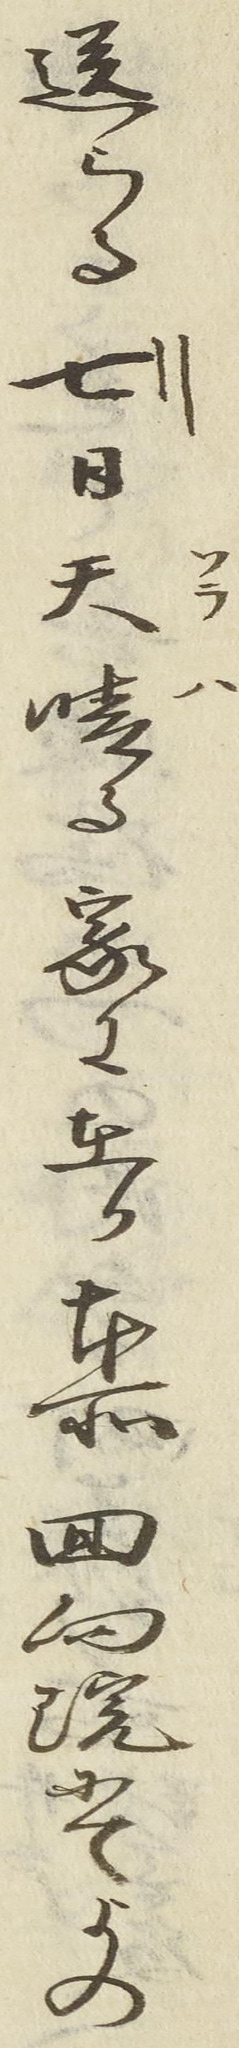送らる七日天晴る家に在り本所回向院にてよの
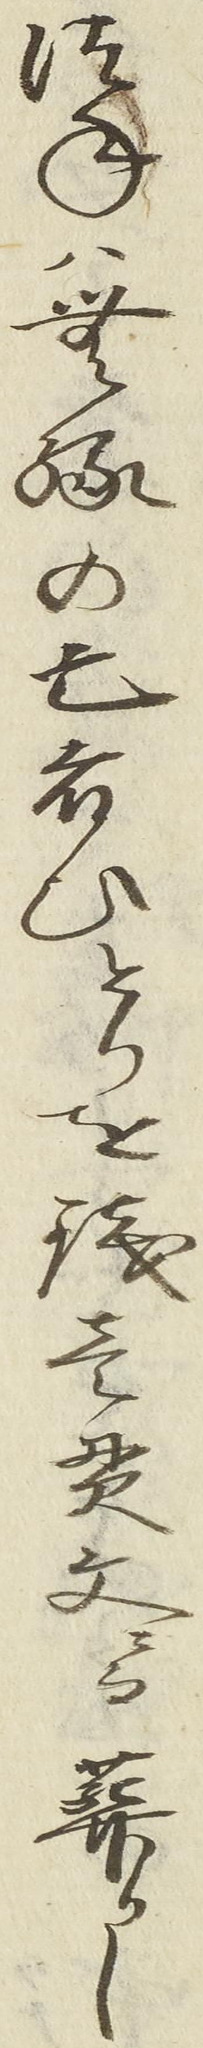つねは無縁の亡者ひとりを銭壱貫文にて葬りし
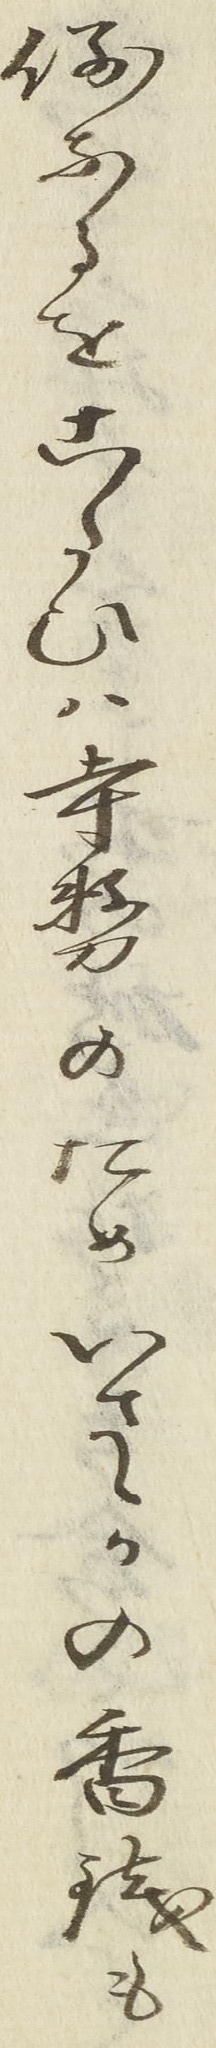例なるをこたひは寺務のためいさゝかの香銭も
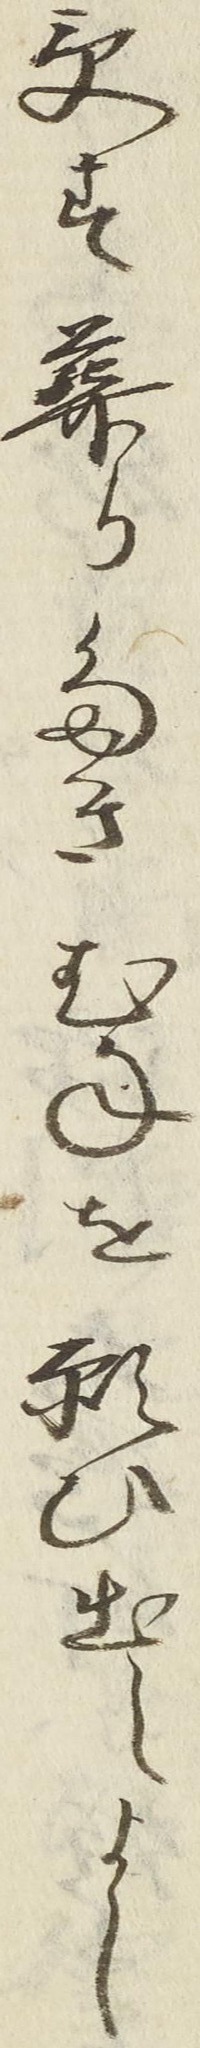受す葬りたきむねを願ひ出しよし
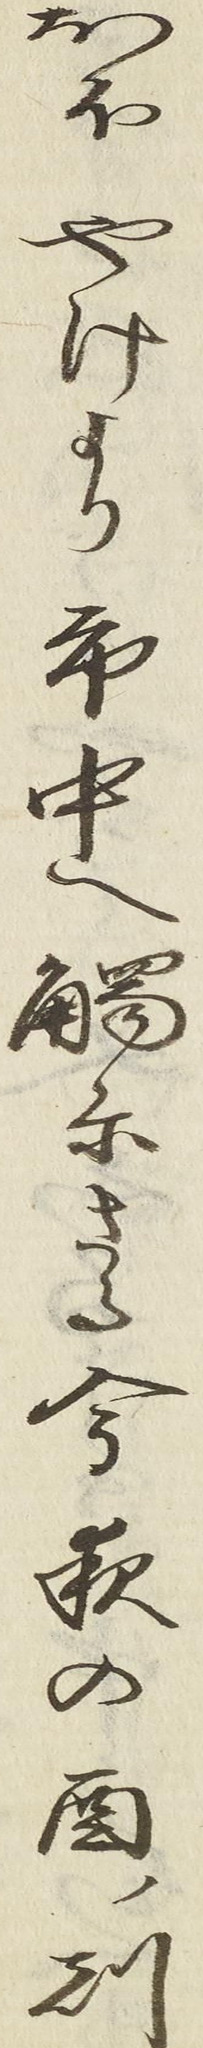おほやけより市中へ觸示さる今夜の酉刻
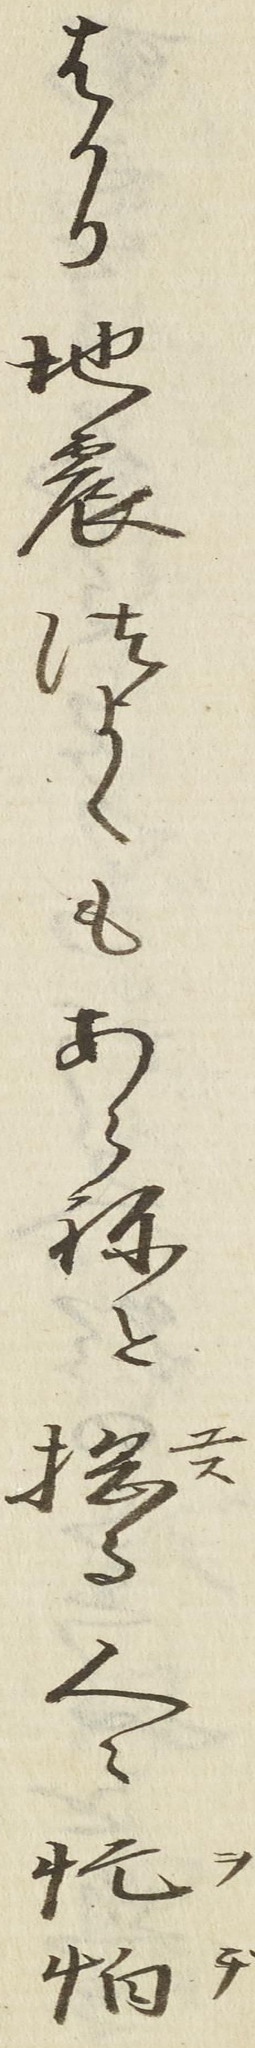はかり地震つよくもあらねと揺る人〻忙怕
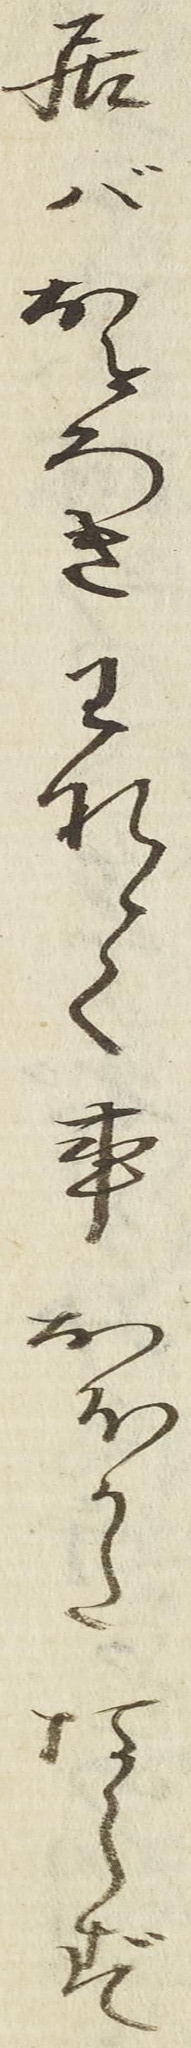居ばおとろきわなゝく事おほかたならず
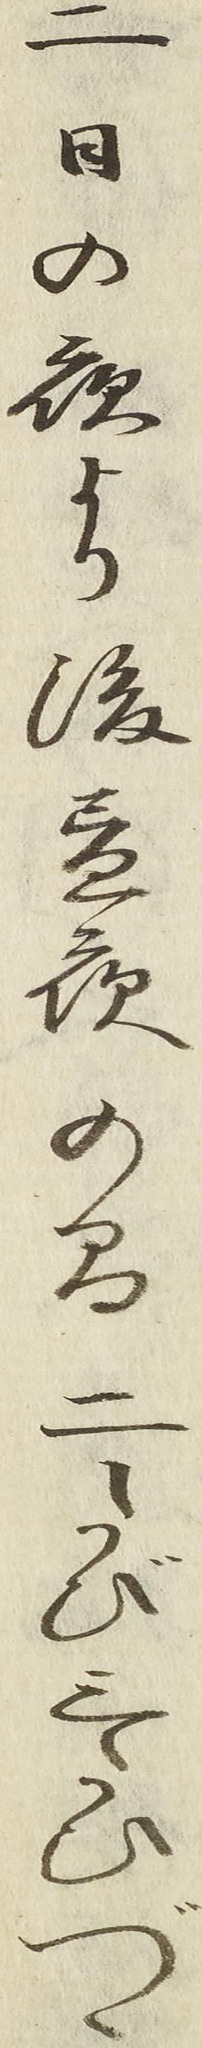二日の夜より後昼夜の間二たび三たひづゝ
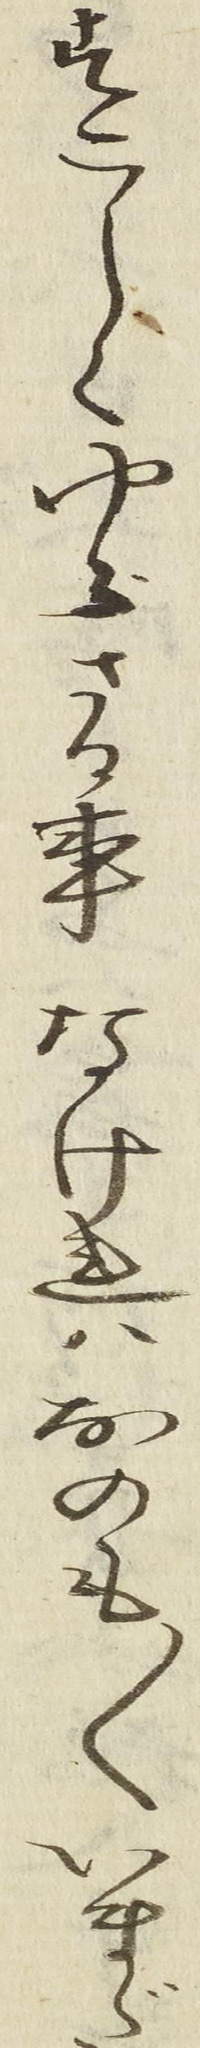すこしくゆらさる事なけれはおのも〳〵いまだ
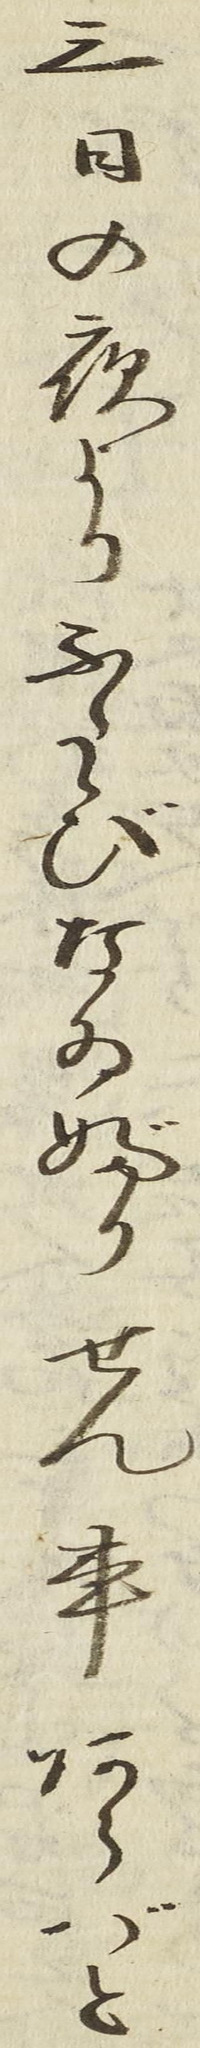三日の夜よりふたゝびなゐぶりせん事あらばと
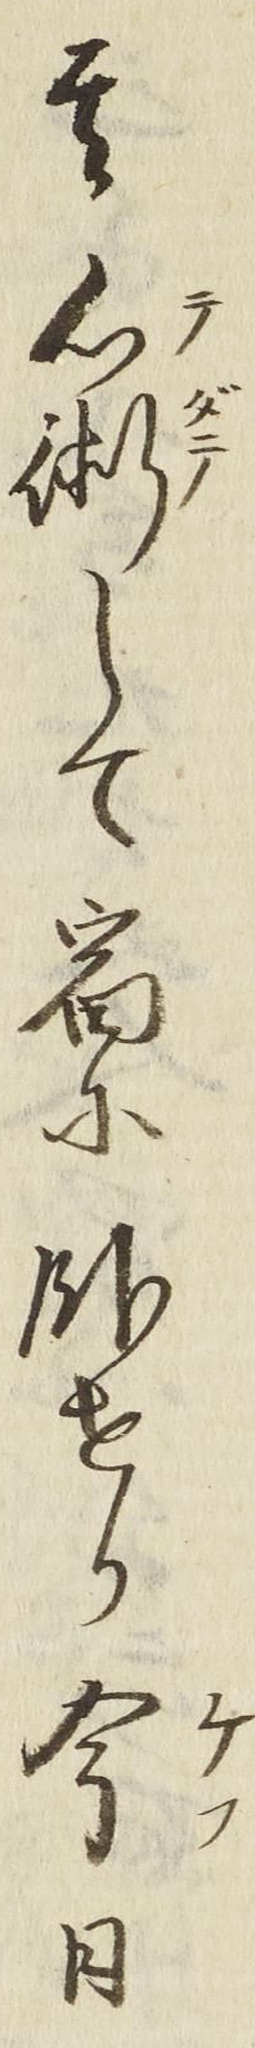其心術して宿に臥せり今日
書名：やぶれ窓の記　全
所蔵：東京大学地震研究所図書室 Earthquake Research Institute Library, The University of Tokyo, JAPAN
